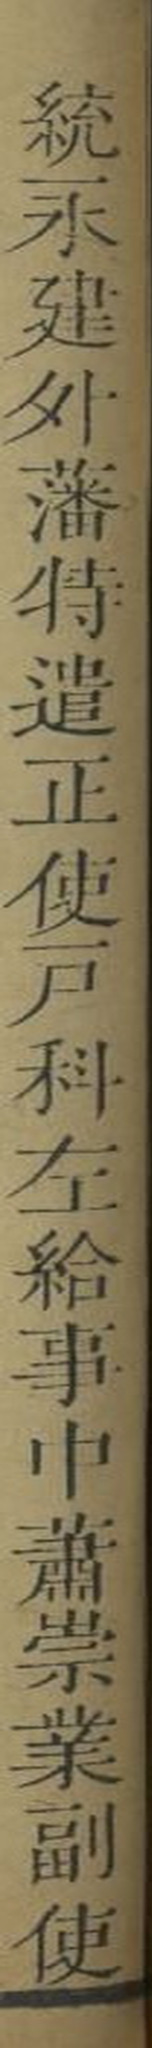統永建外藩特遣正使戸科左給事中蕭崇業副使
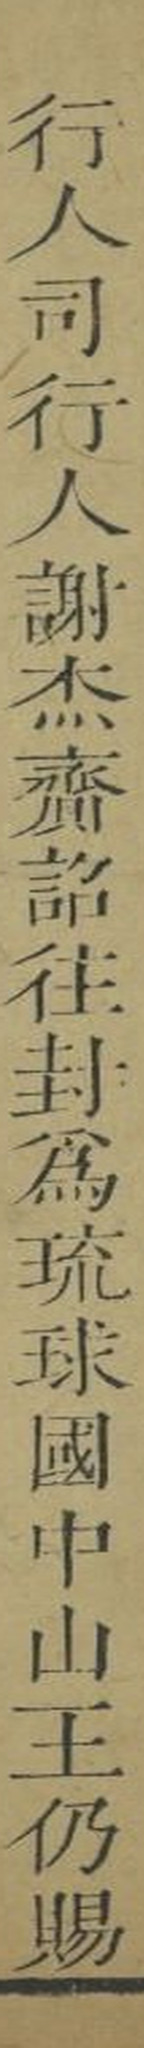行人司行人謝杰齎詔往封為琉球国中山王仍賜
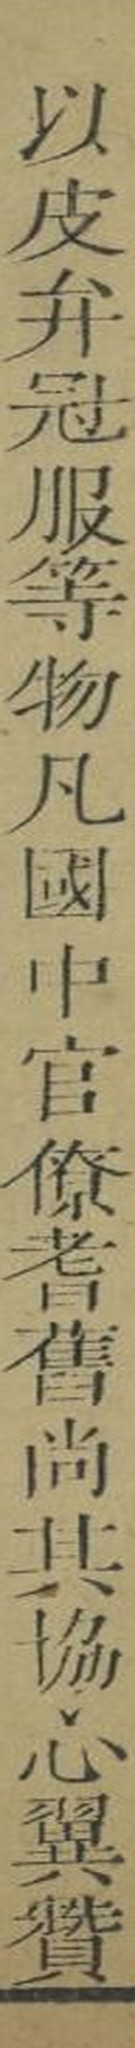以皮弁冠服等物凡国中官僚耆旧尚其協心翼賛
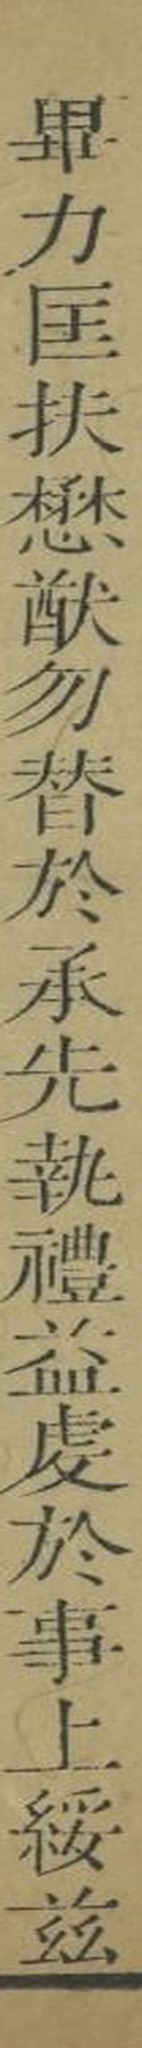畢力匡扶懋猷勿替於承先執礼益虔於事上綏茲
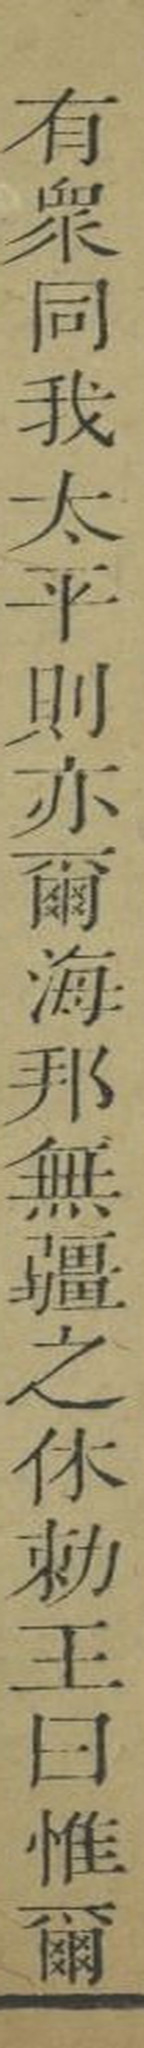有衆同我太平則亦爾海邦無疆之休勅王曰惟爾
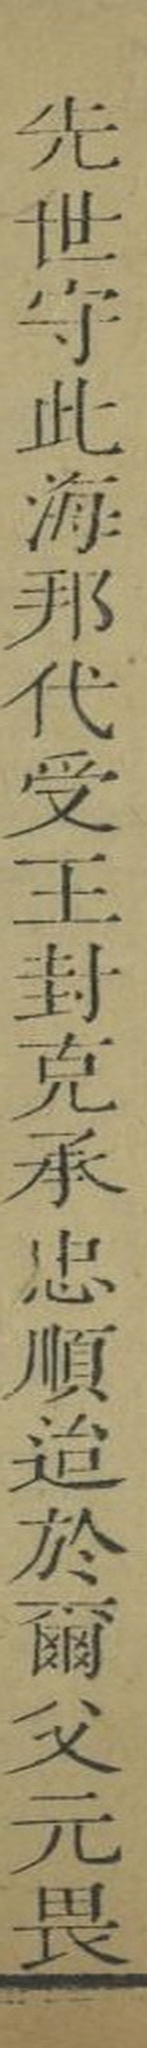先世守此海邦代受王封克承忠順迨於爾父元畏
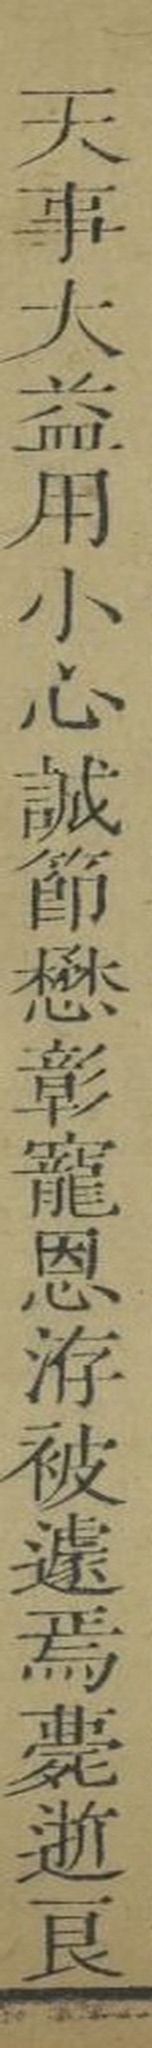天事大益用小心誠節懋彰寵恩洊被遽焉薨逝良
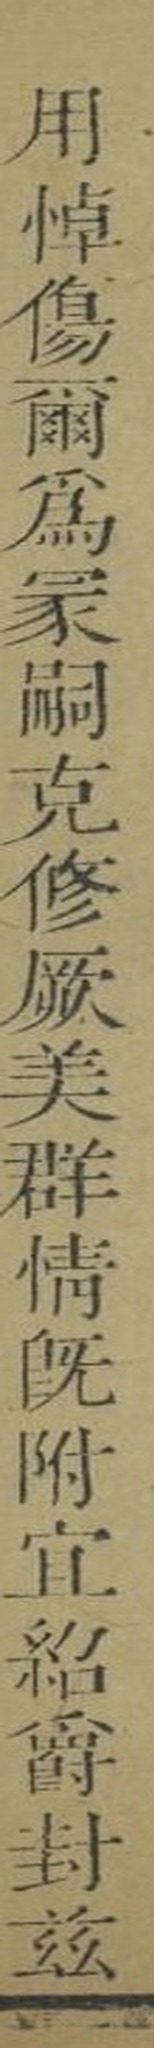用悼傷爾為冡嗣克修厥美群情既附宜紹爵封茲
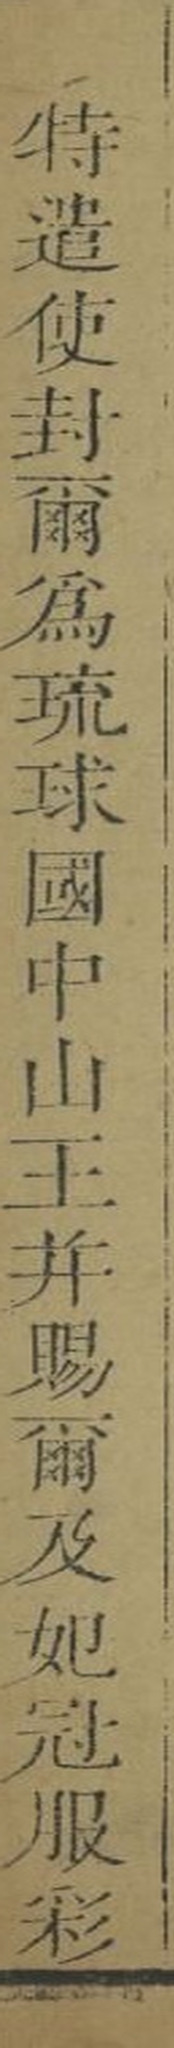特遣使封爾為琉球国中山王并賜爾及妃冠服彩

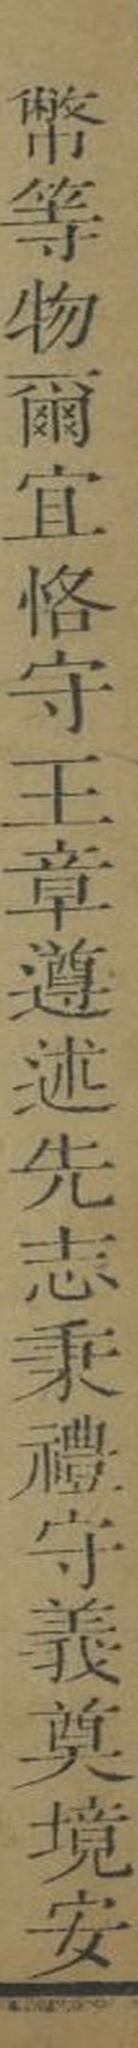幣等物爾宜恪守王章遵述先志秉礼守義奠境安
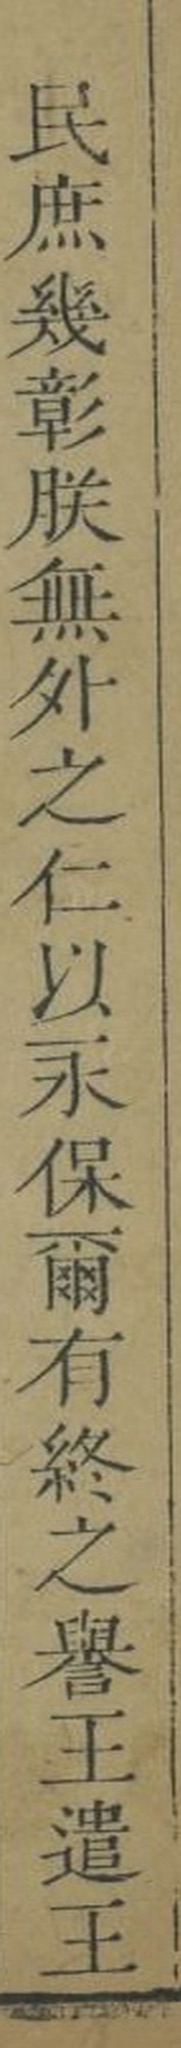民庶幾彰朕無外之仁以永保爾有終之誉王遣王
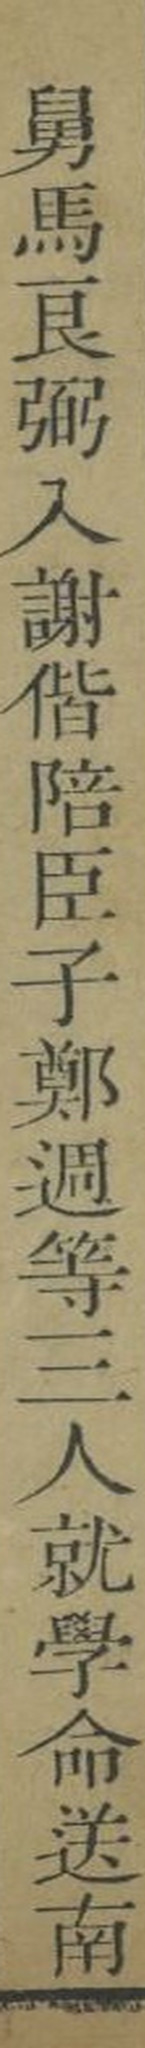舅馬良弼入謝偕陪臣子鄭週等三人就学命送南
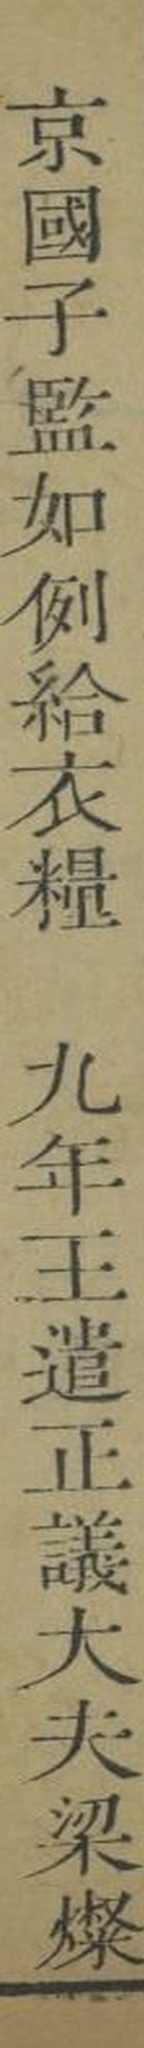京国子監如例給衣糧九年王遣正議大夫梁燦
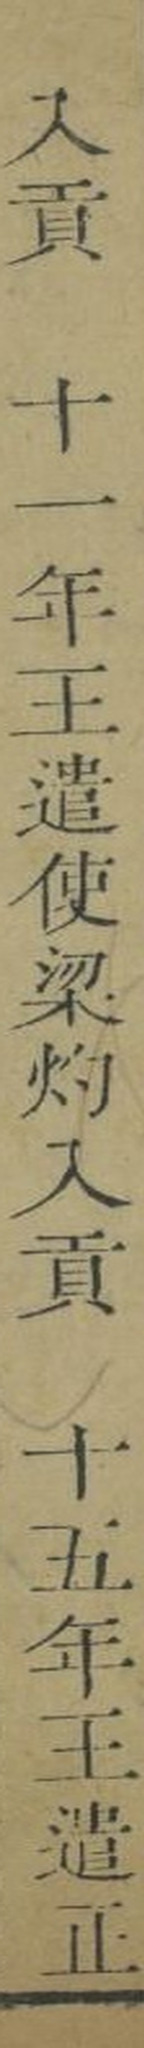入貢十一年王遣使梁灼入貢十五年王遣正
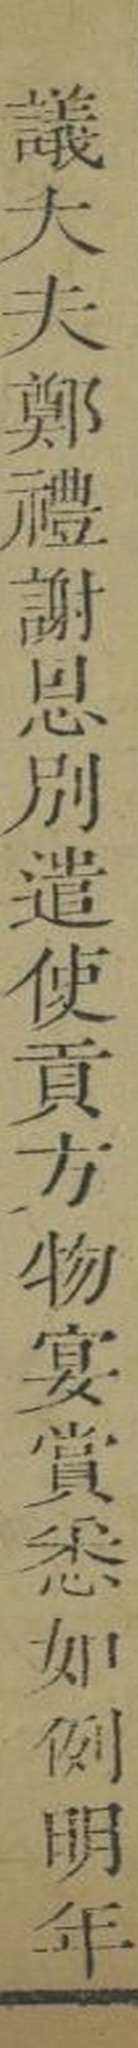議大夫鄭礼謝恩別遣使貢方物宴賞悉如例明年
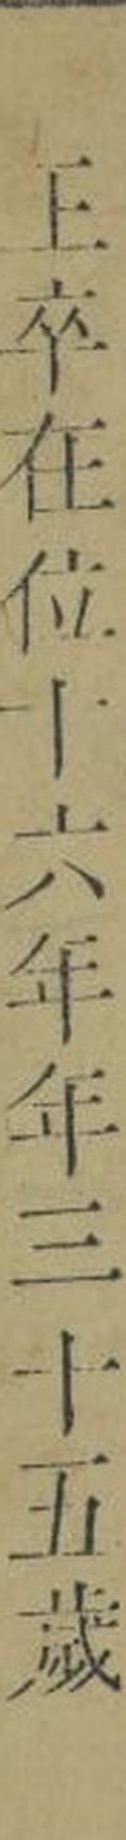王卒在位十六年年三十五歳
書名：中山伝信録 巻三
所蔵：University of the Ryukyus Library
